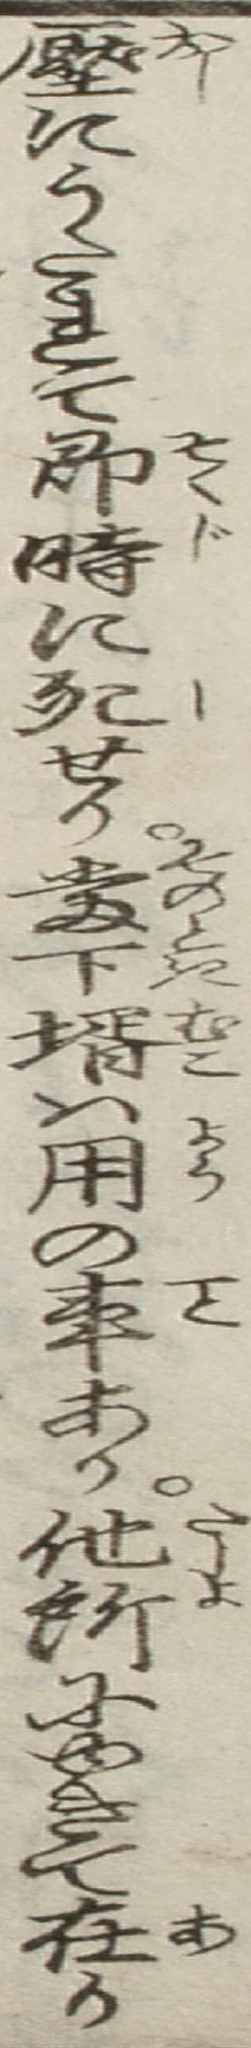圧にうたれて即時に死せり。当下婿は用の事あり。他所にゆきて在り
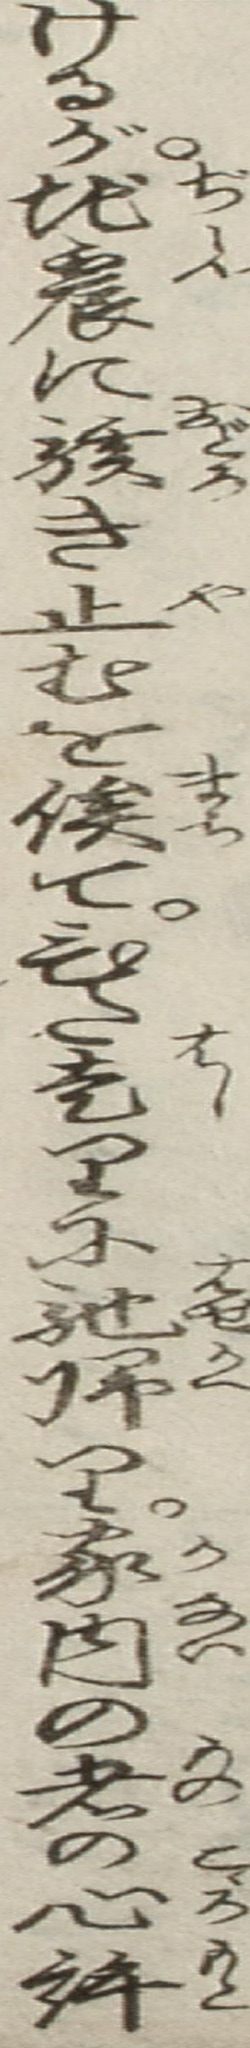けるが。地震に駭き止むを俟て。ひた走りに馳帰り。家内の者の心許
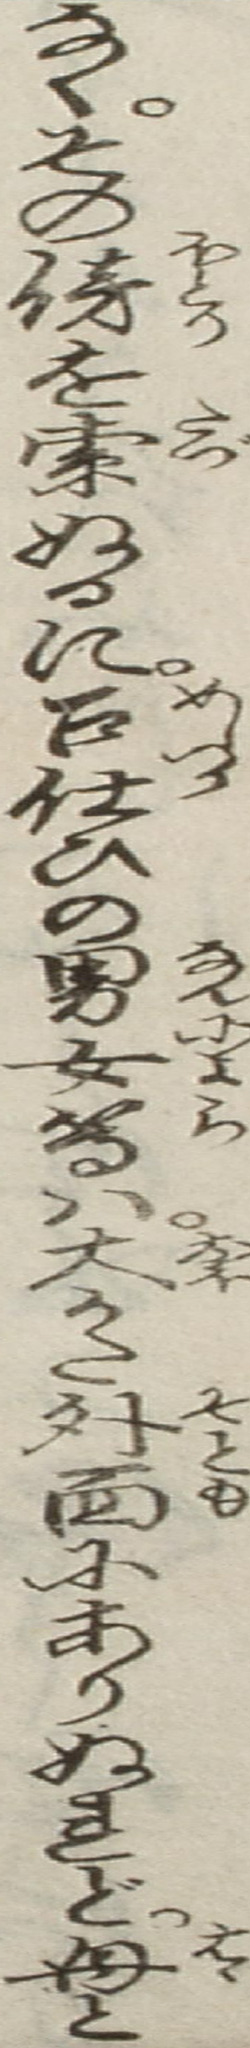なく。その傍を索ぬるに。召仕ひの男女等は。大かた外面にありぬれど。母と
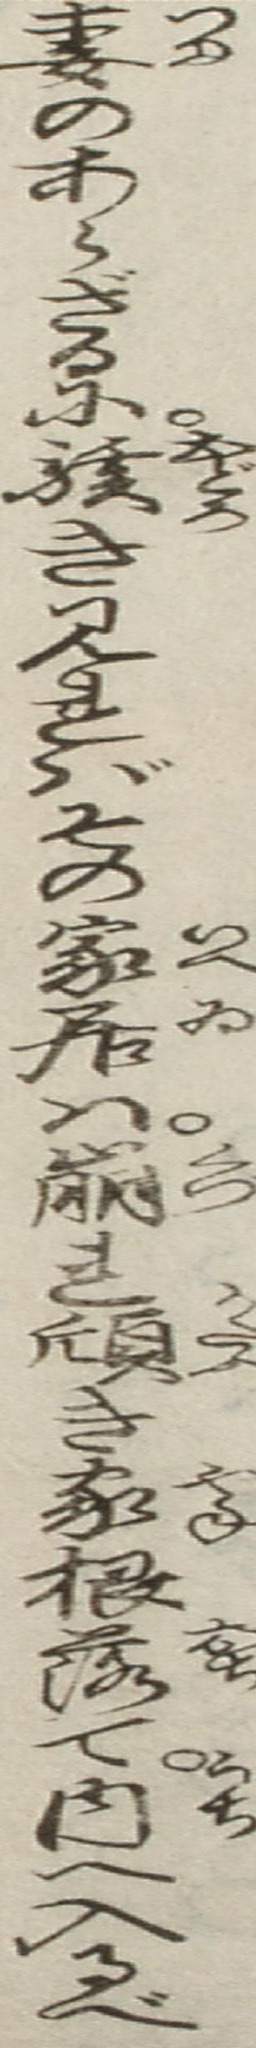妻のあらざるに。駭き見ればその家居は。崩れ傾き家根落て。内へ入るべ
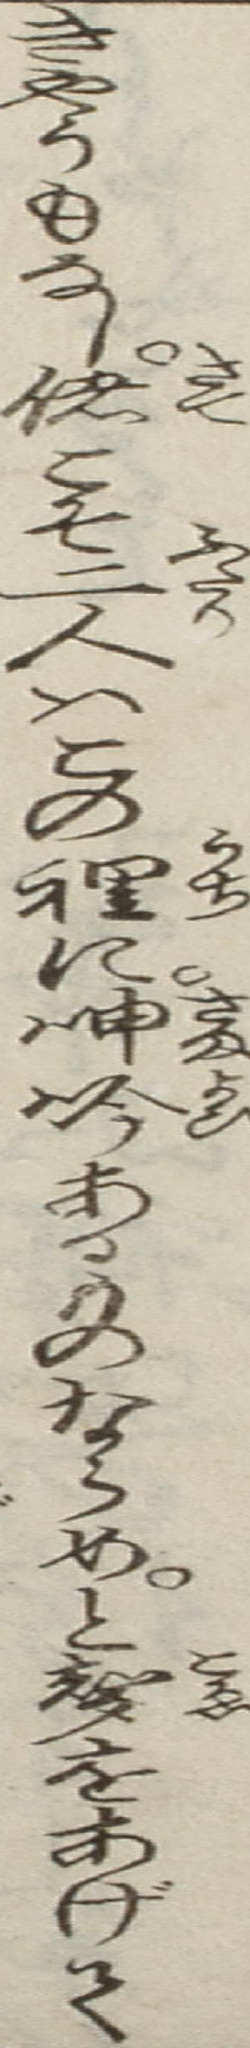きやうもなし。偖こそ二人はこの裡に。呻吟あるものならめ。と声をあげて
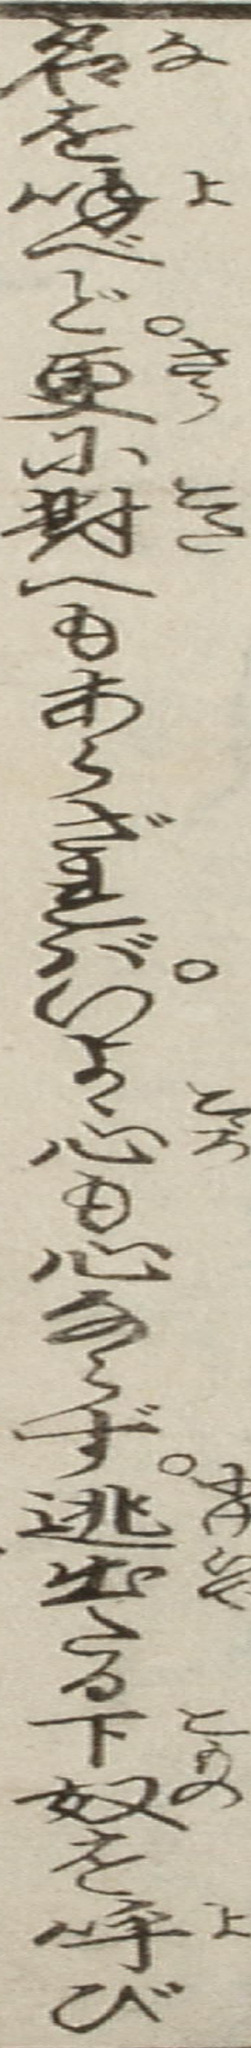名を呼べど。更に對へもあらざれば。いよゝ心も心ならず。逃出たる下奴を呼び
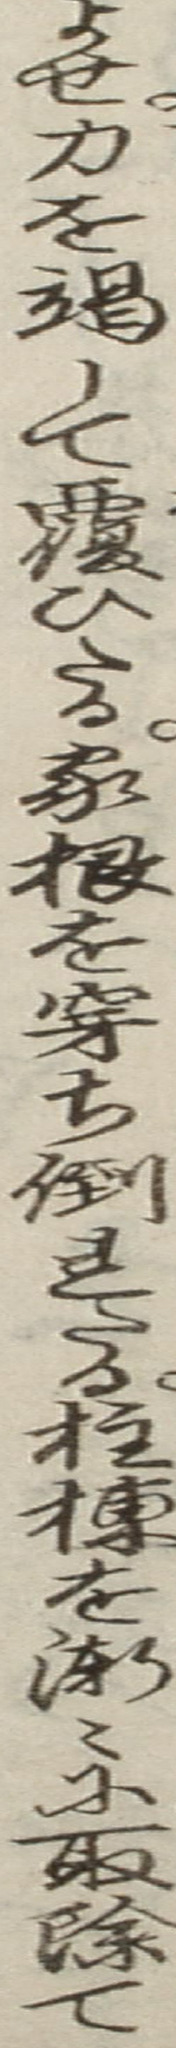よせ。力を竭して覆ひたる。家根を穿ち倒れたる。柱棟を漸〻に。取除て
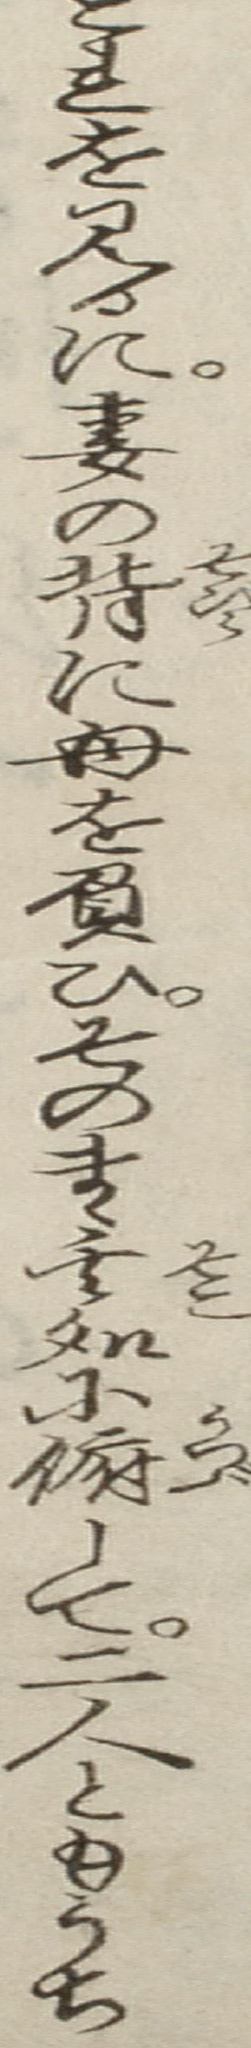これを見るに。妻の背に母を負ひ。そのまゝ其処に俯して。二人ともうち
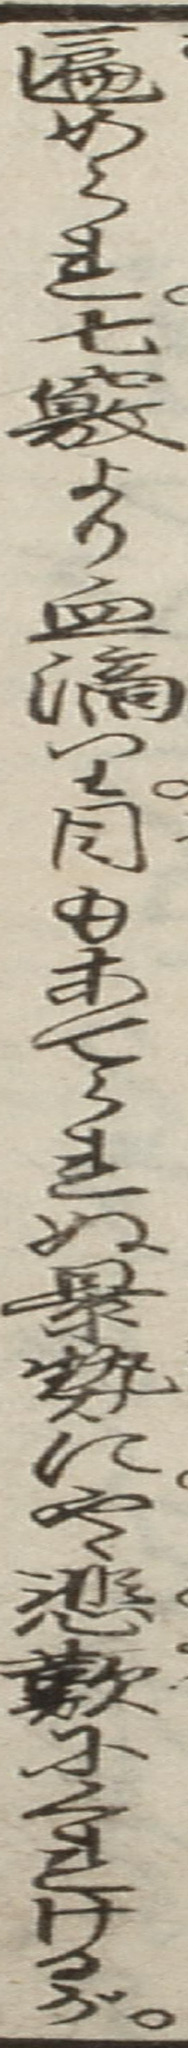匾められ。七竅より血滴り。目もあてられぬ景勢に。やゝ悲嘆にくれけるが。
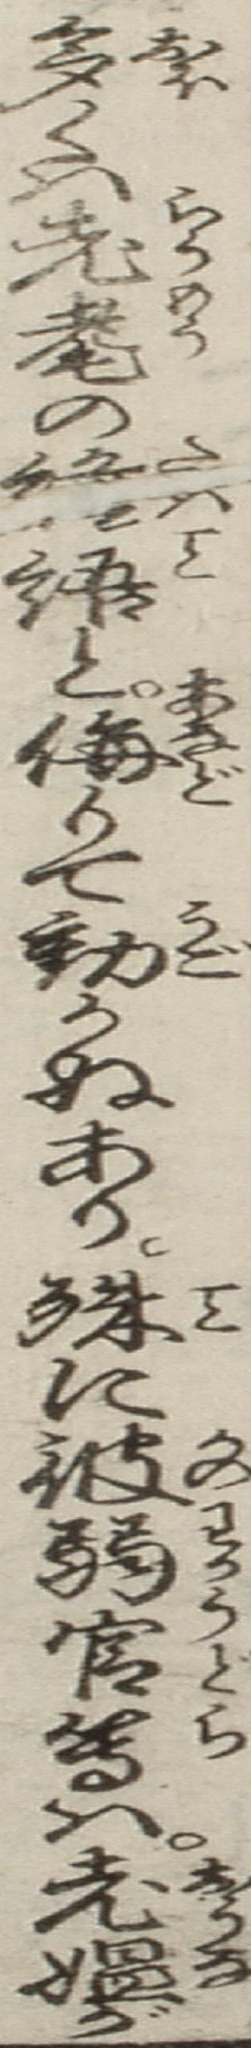多くは老耄の讒語と。侮りて動かぬあり。殊に彼弱官等は。老媼が
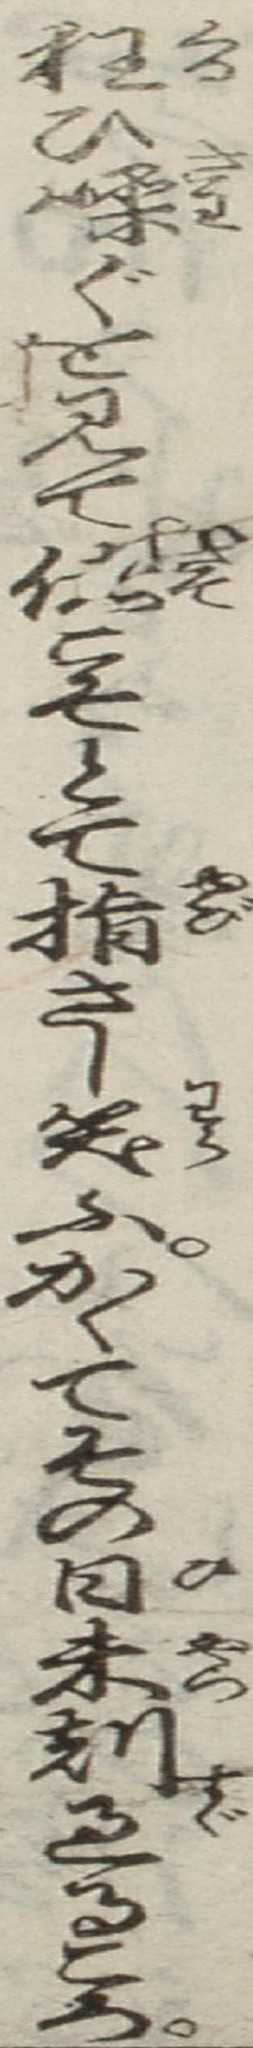狂ひ躁ぐを見て。偖こそとて指さし笑ふ。かくてその日未刻過るころ。
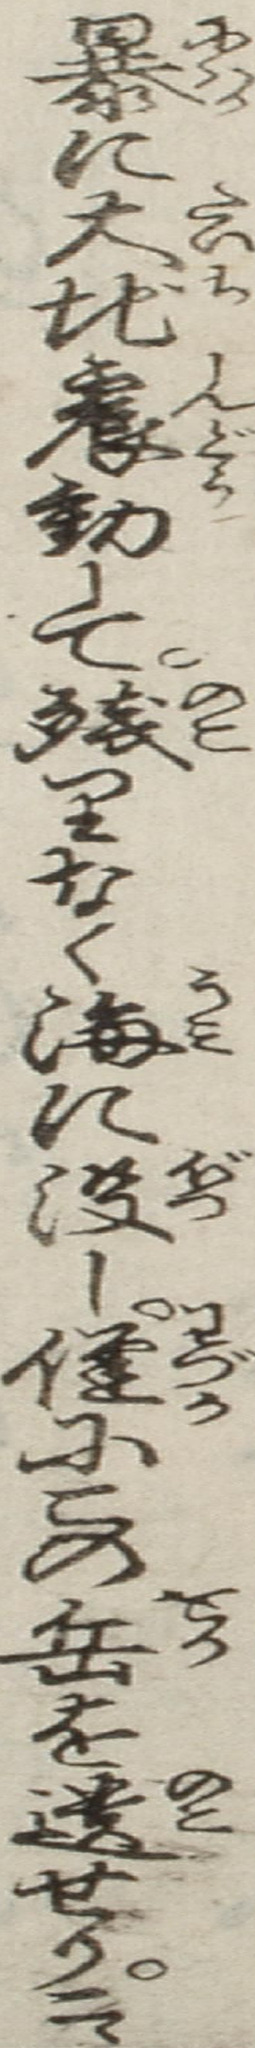暴に大地震動して。残りなく海に没し。僅にこの岳を遺せり。こゝ
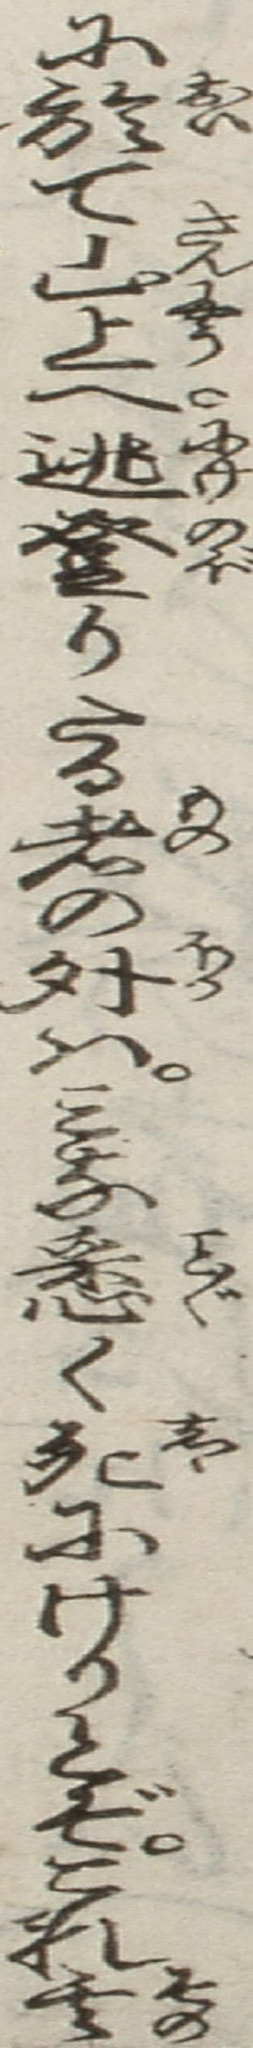に於て山上へ。逃登りたる者の外は。みな悉く死にけりとぞ。これ其
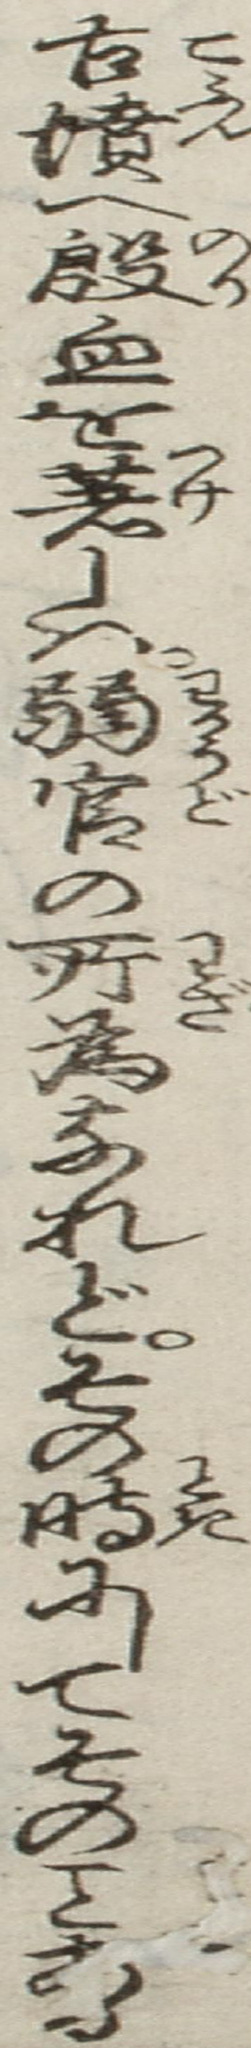古墳へ殷血を著しは。弱官の所為なれど。その時にしてそのことある
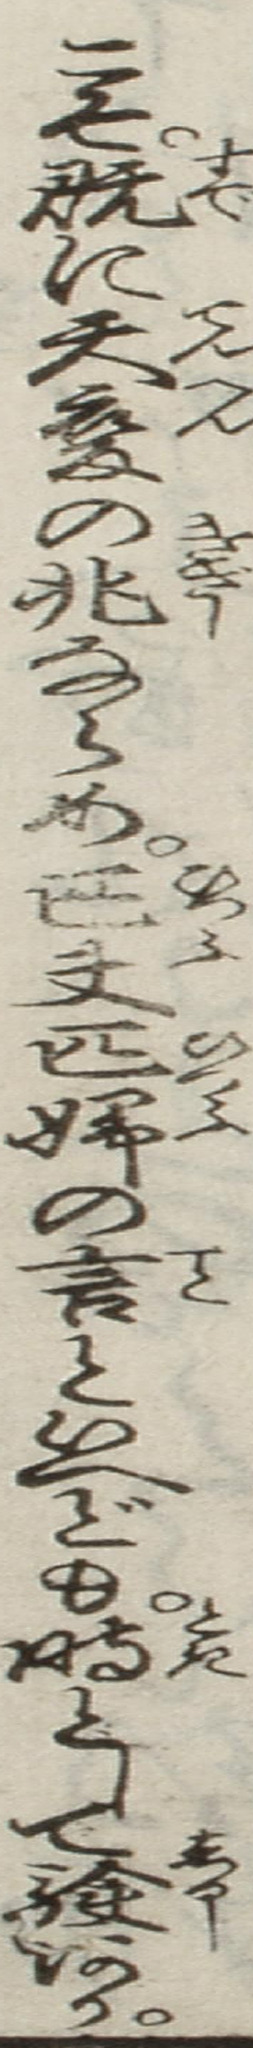こそ。既に天変の兆ならめ。匹夫匹婦の言といへども。時として験あり。
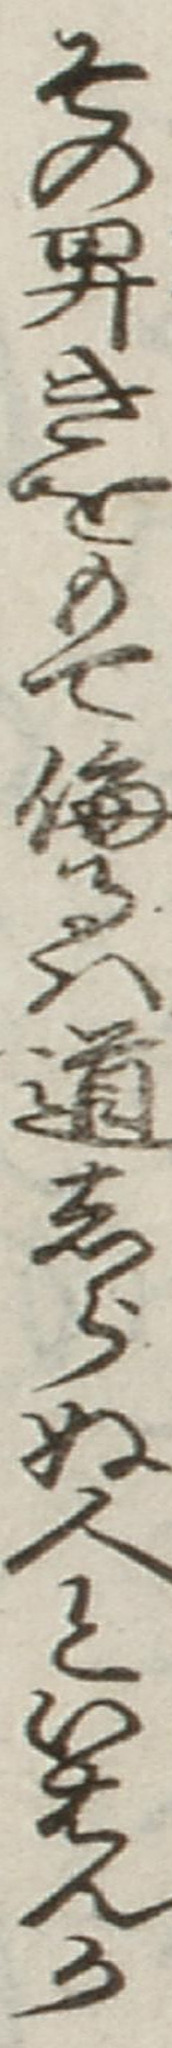その卑きをもて侮るは。道しらぬ人といはんか
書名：安政見聞録　上
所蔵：東京大学地震研究所図書室 Earthquake Research Institute Library, The University of Tokyo, JAPAN
